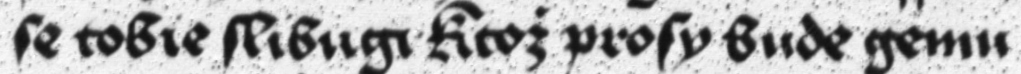ſe tobie ſlibugi. Ktoż proſy bude gemu
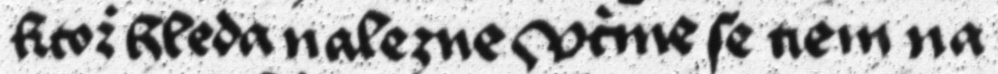ktoż hleda nalezne Vċine ſe tíem na
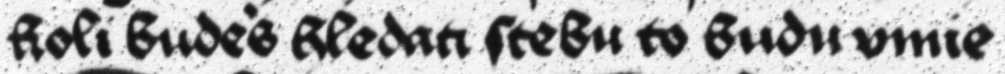koli budeṡ hledati ſtebu to budu vmie
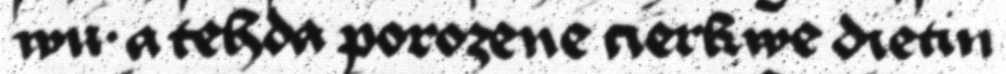wú. a tehda porozené cíerkwe dietin
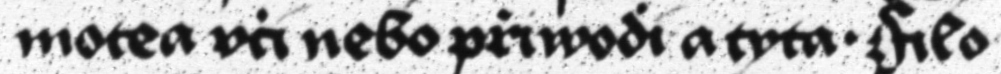motea vċí nebo pṙiwoḋí a tyta. Filo
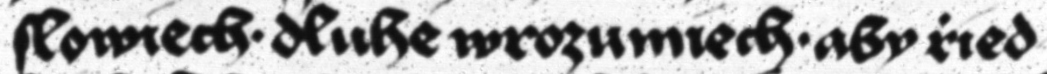ſlowíech. dluhé wrozumíech. aby ṙíed
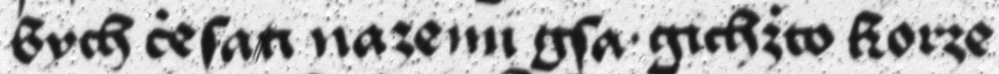bych ċeſati na zemi gſa. gichżto korze
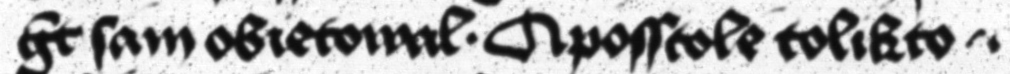ḡt ſam obietowal. A poſſtolé tolikto
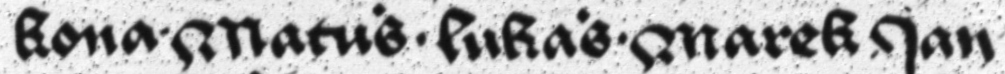kona. Matuṡ. lukaṡ. Marek. Ian
